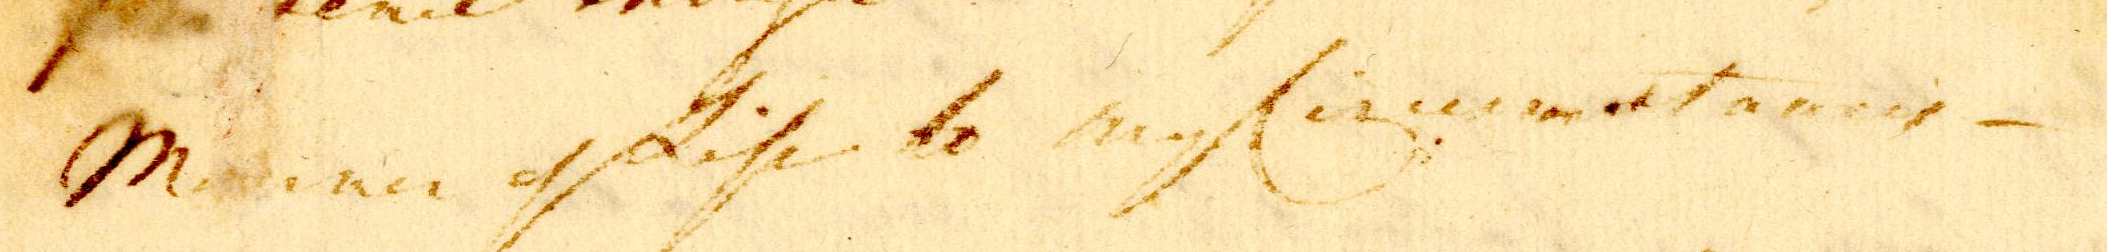Manner of Life to my Circumstances.
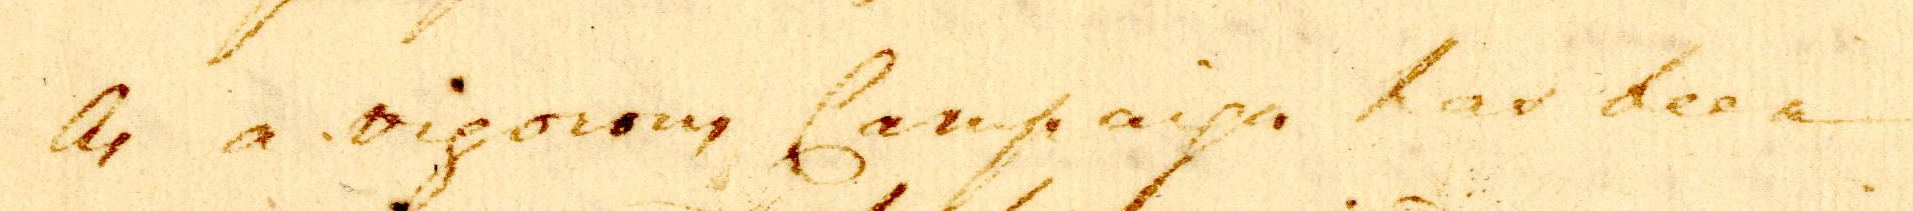As a vigorous Campaign has been
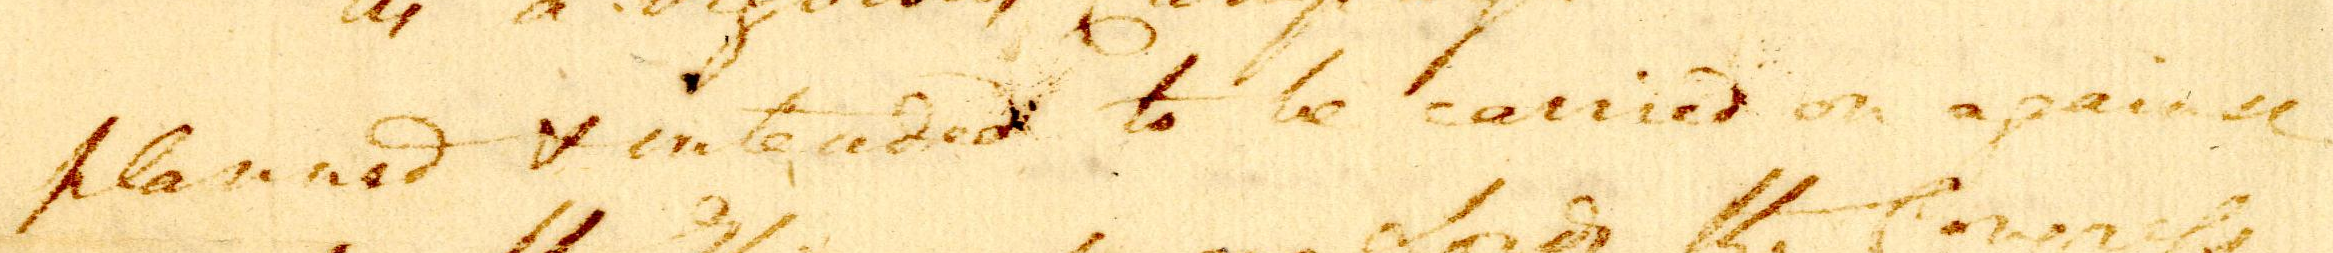planned & intended to be carried on against
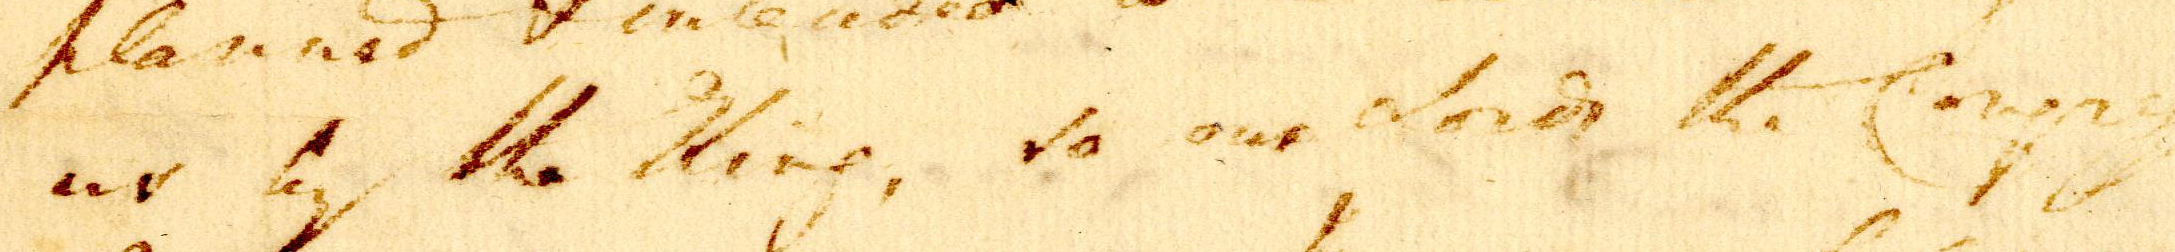us by the King so our Lords the Cover
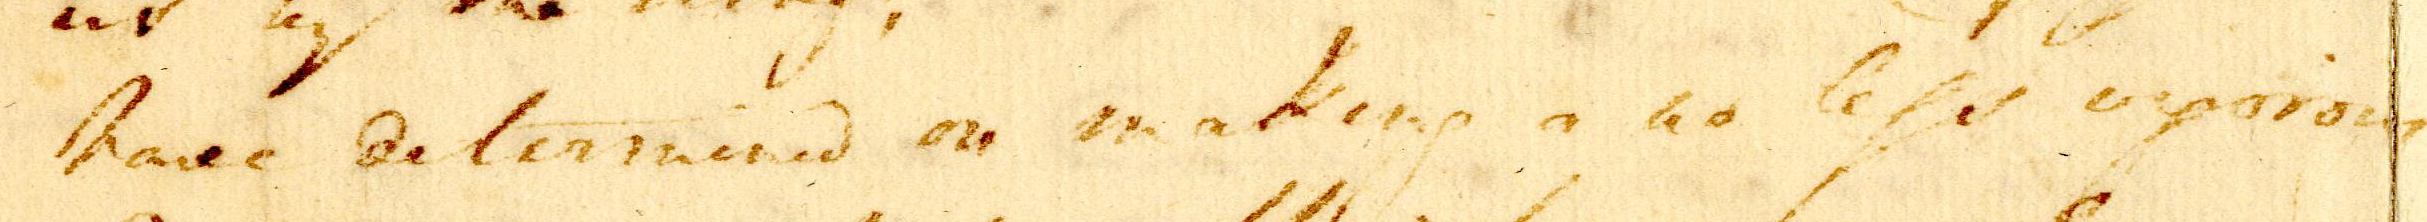have determined on making a no less egregious
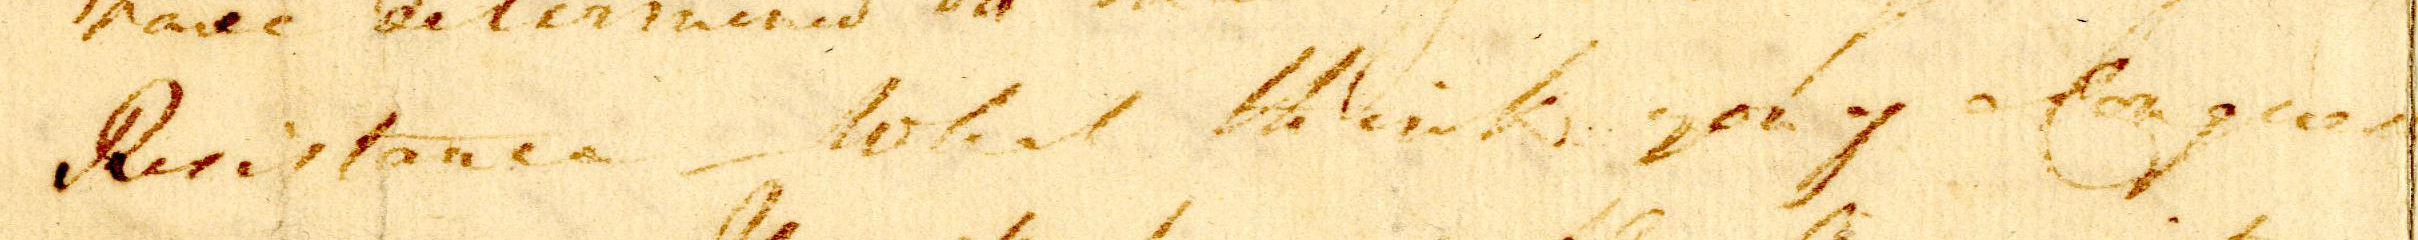Resistance. What think you of Congress
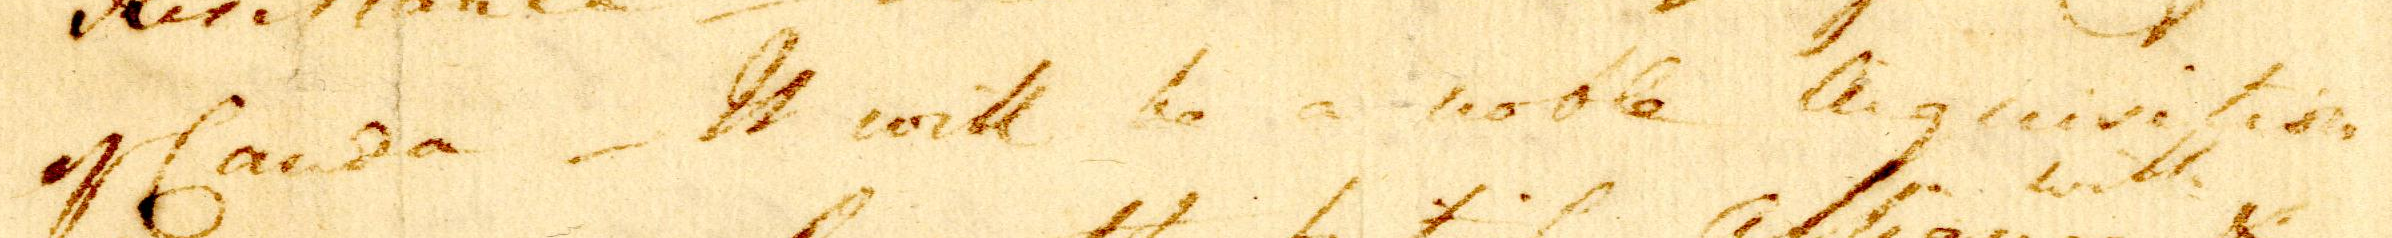of Canada. It will be a noble Augustius
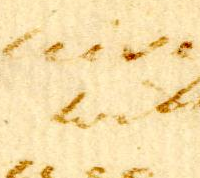doubt
